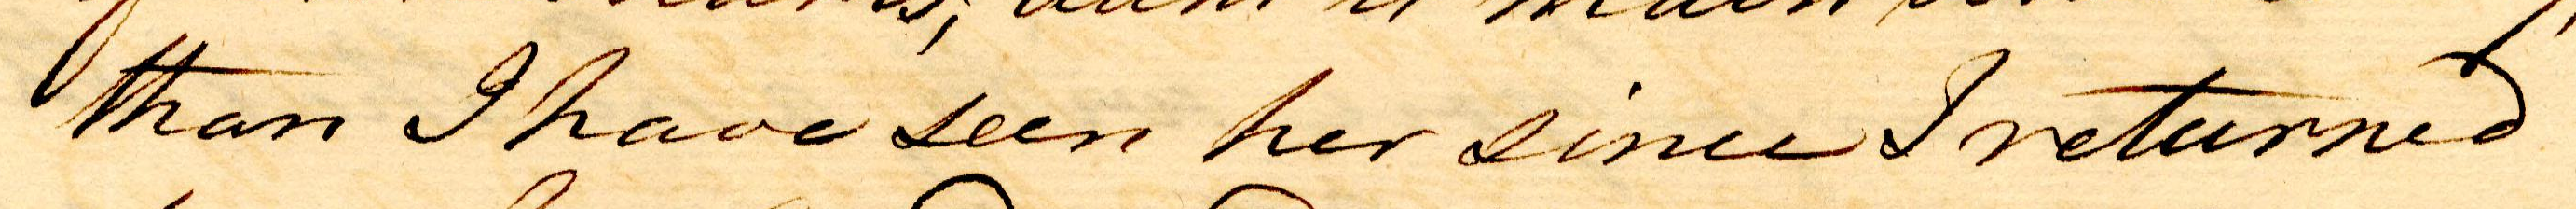than I have seen her since I returned
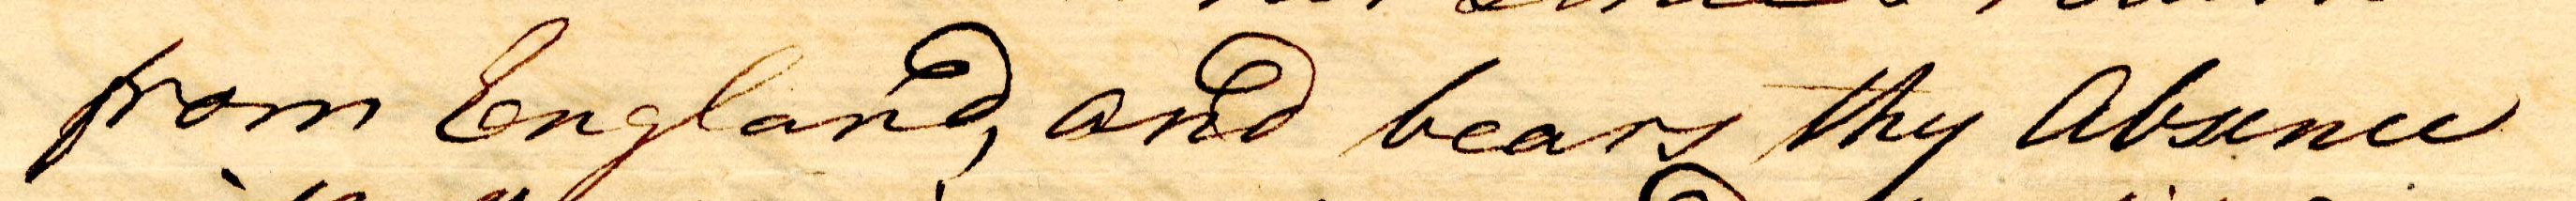from England, and bears thy Absence
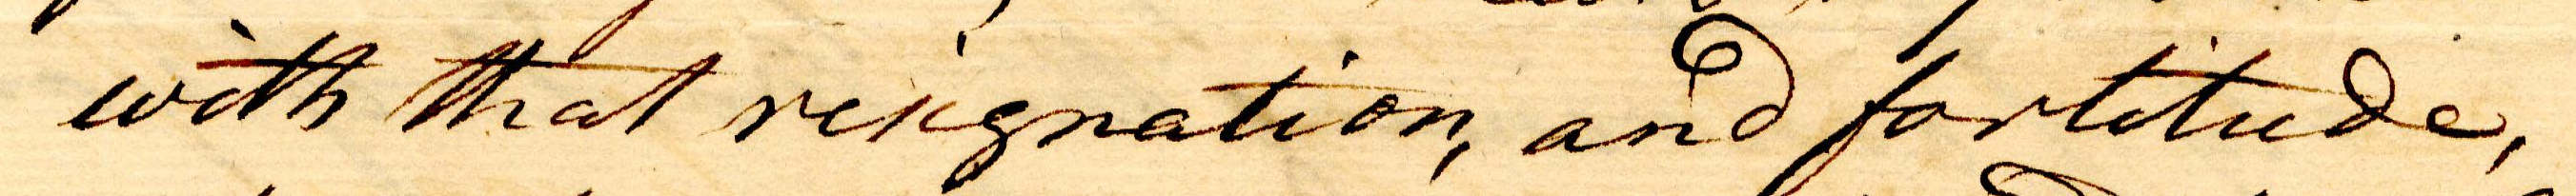with that resignation, and fortitude,
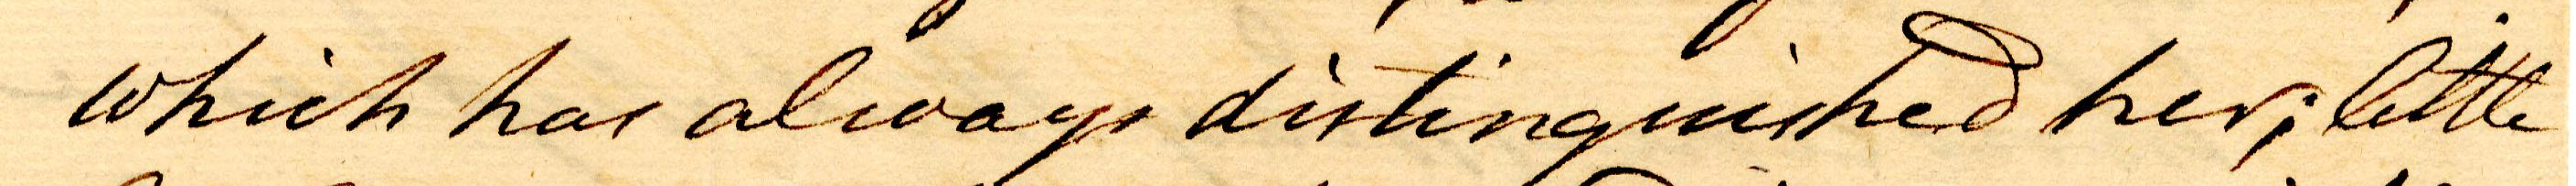which has always distinguished her; little
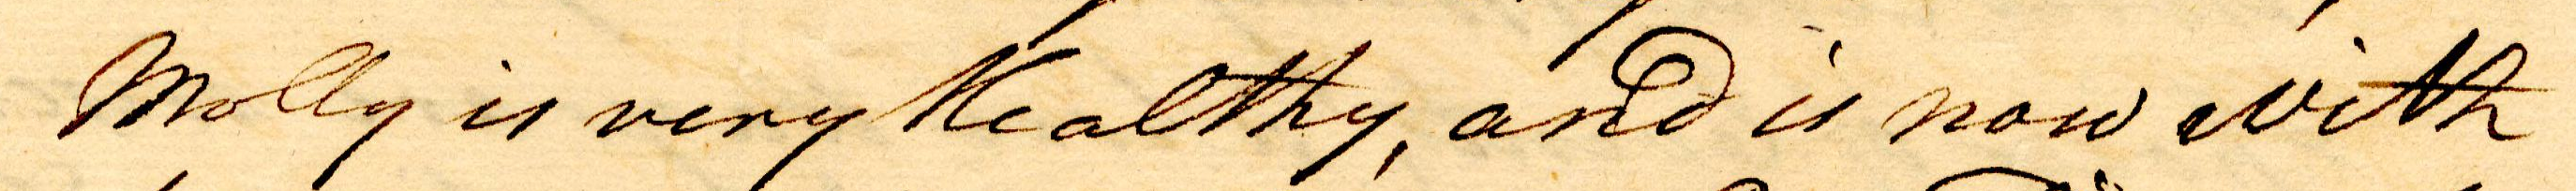Molly is very Healthy, and is now with
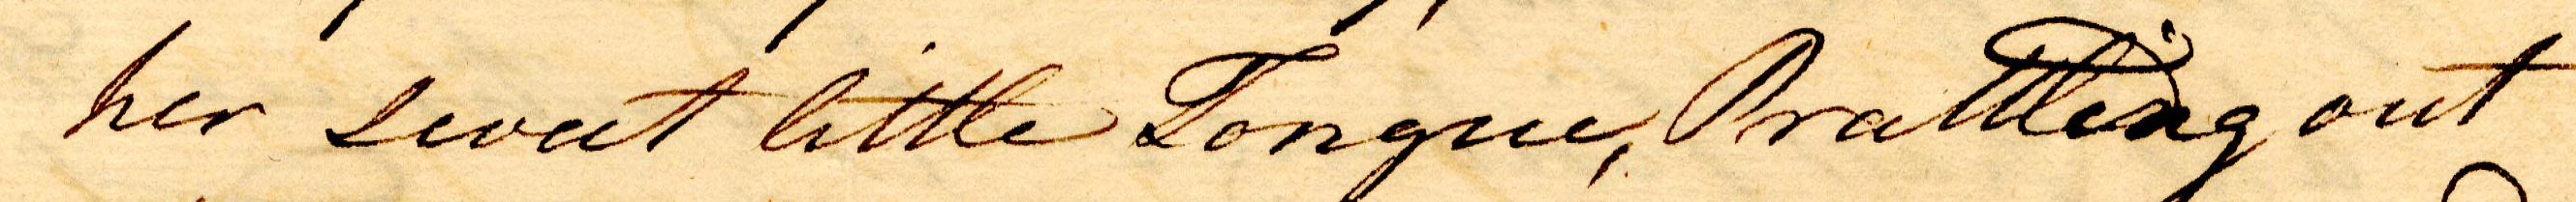her sweet little Tongue Prattling out
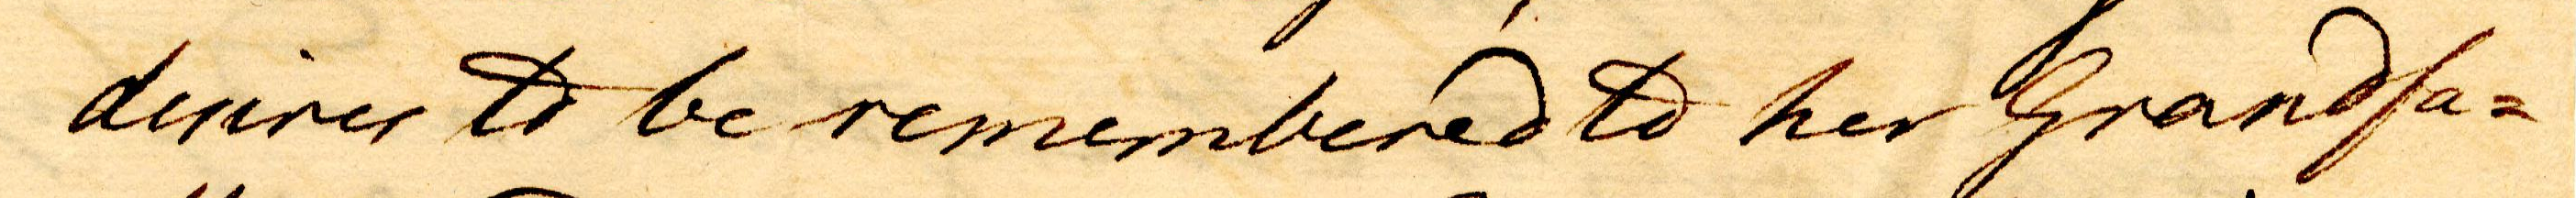desires to be remembered to her Grandfa-
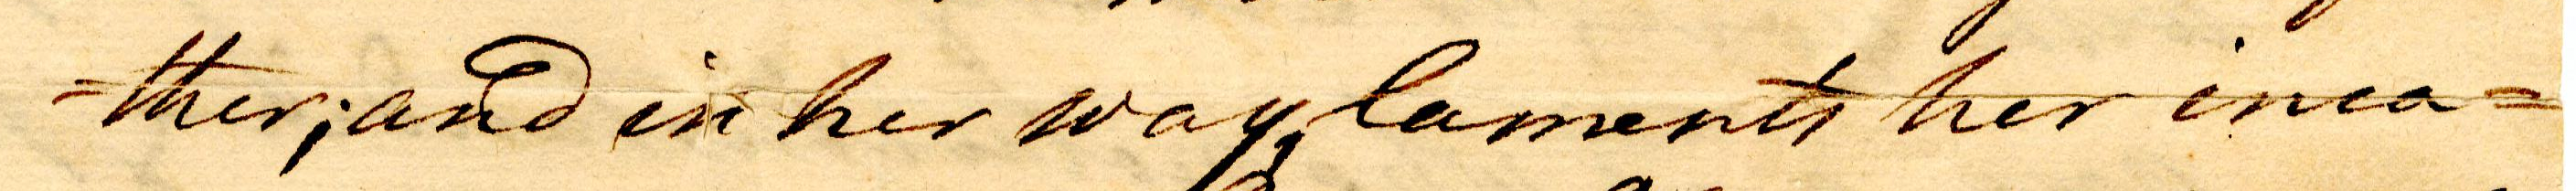-ther; and in her way laments her inca-
